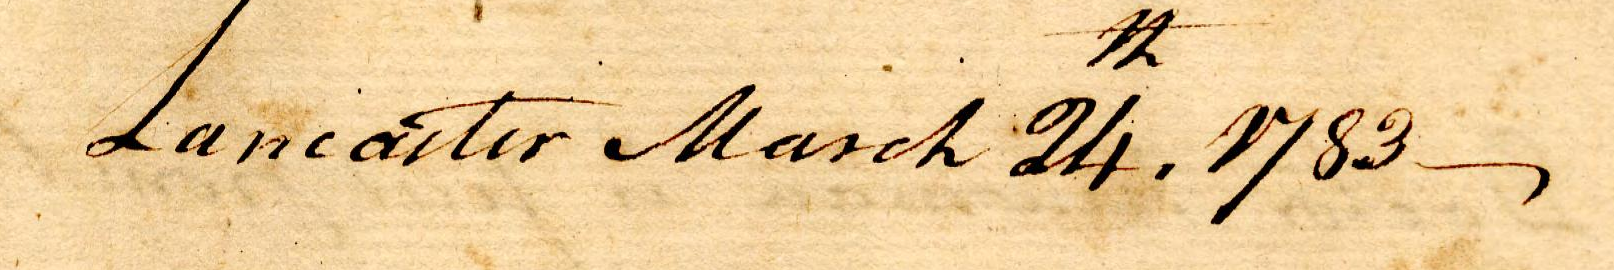Lancaster March 24^th. 1783
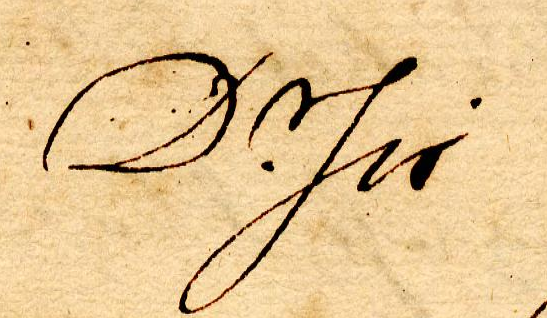D^r sir
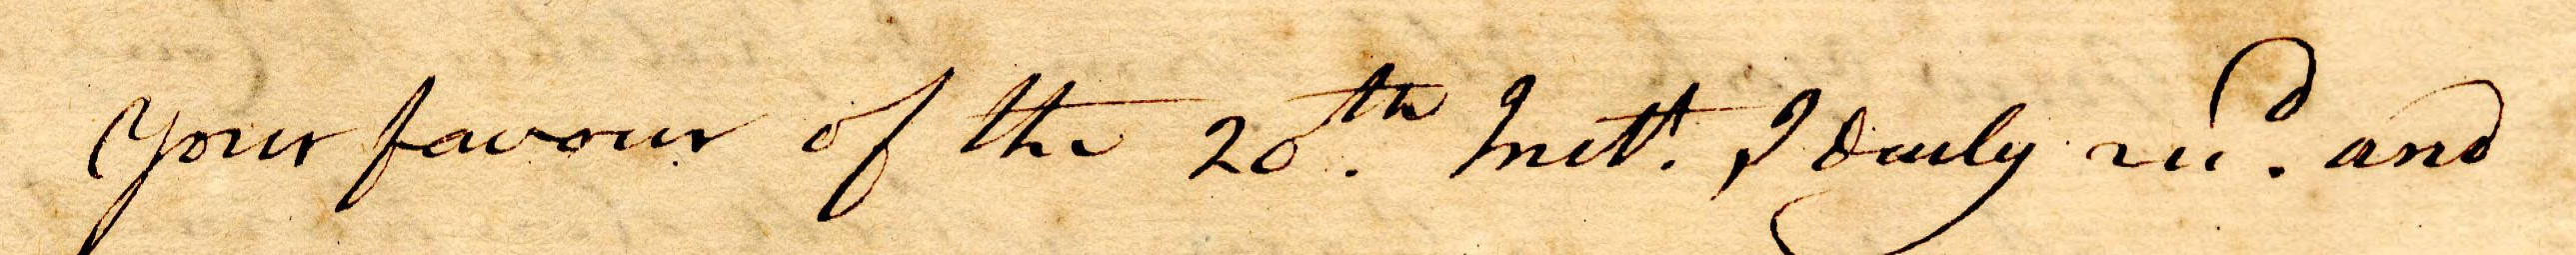Your favour of the 20^th. Inst^t. I duly rec^d. and
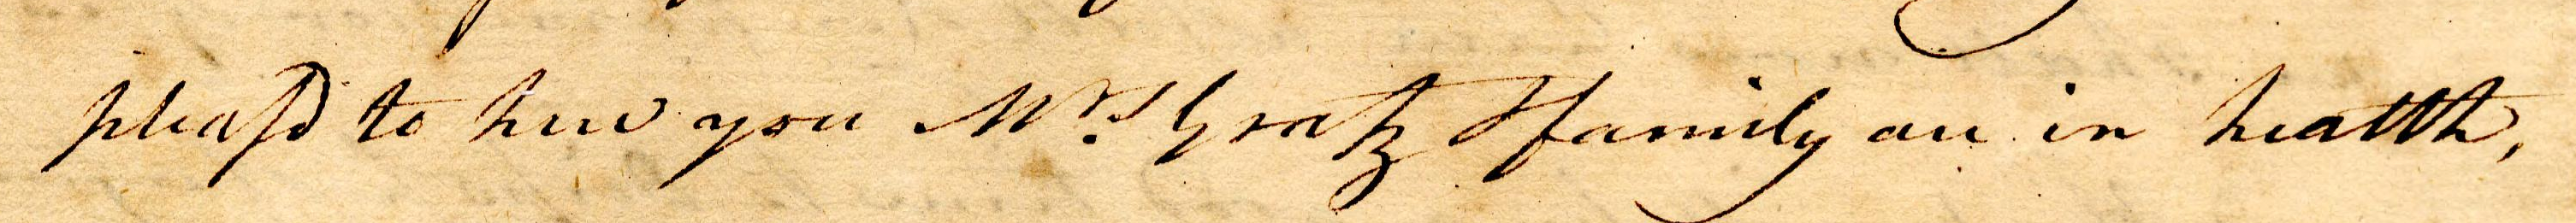pleasd to here you M^rs. Gratz & family are in health,
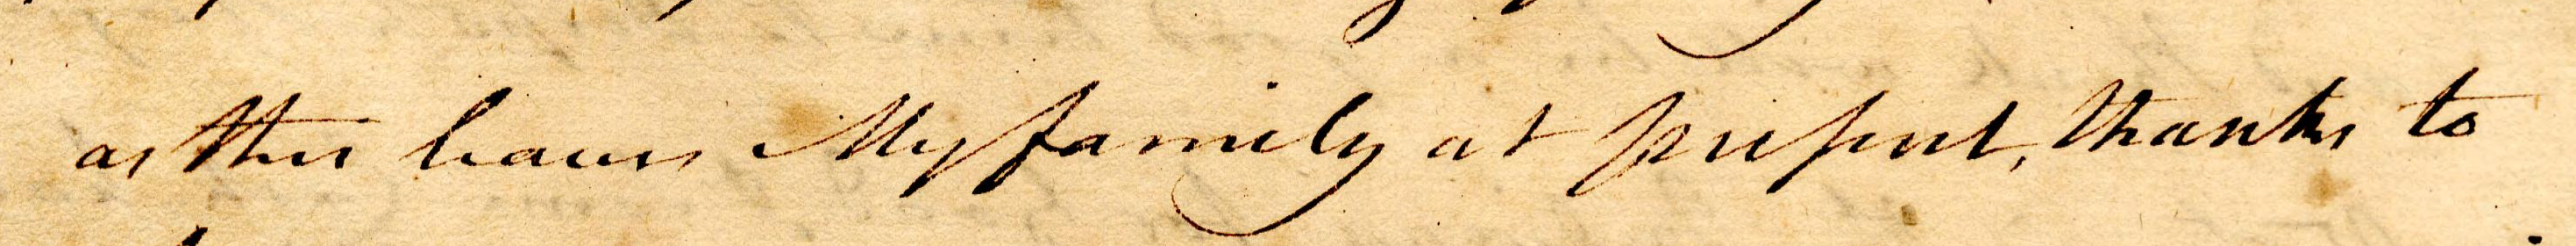as this leaves My family at present, thanks to
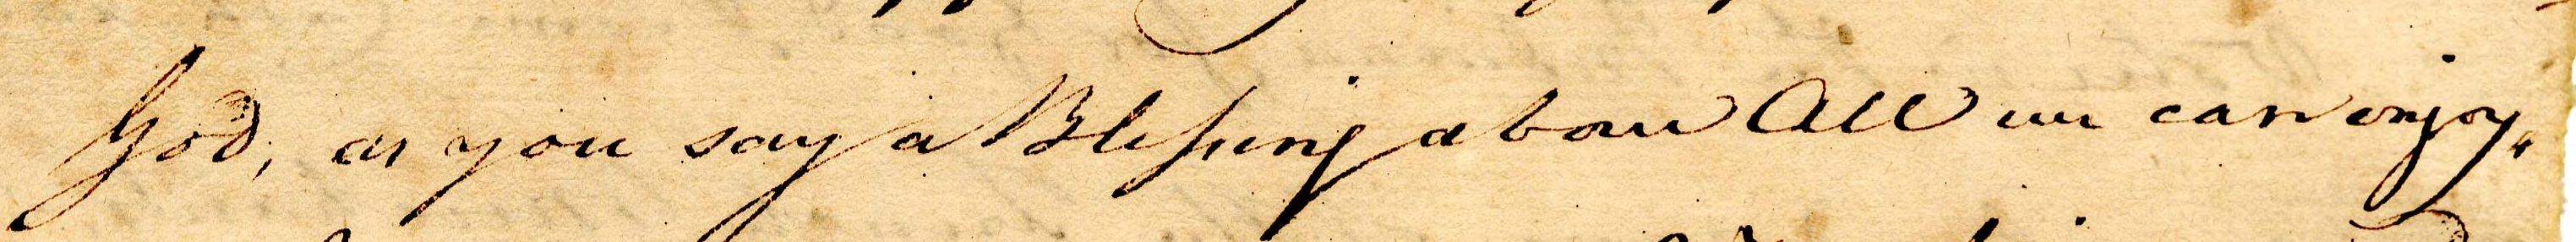God, as you say a Blessing above All we can enjoy,
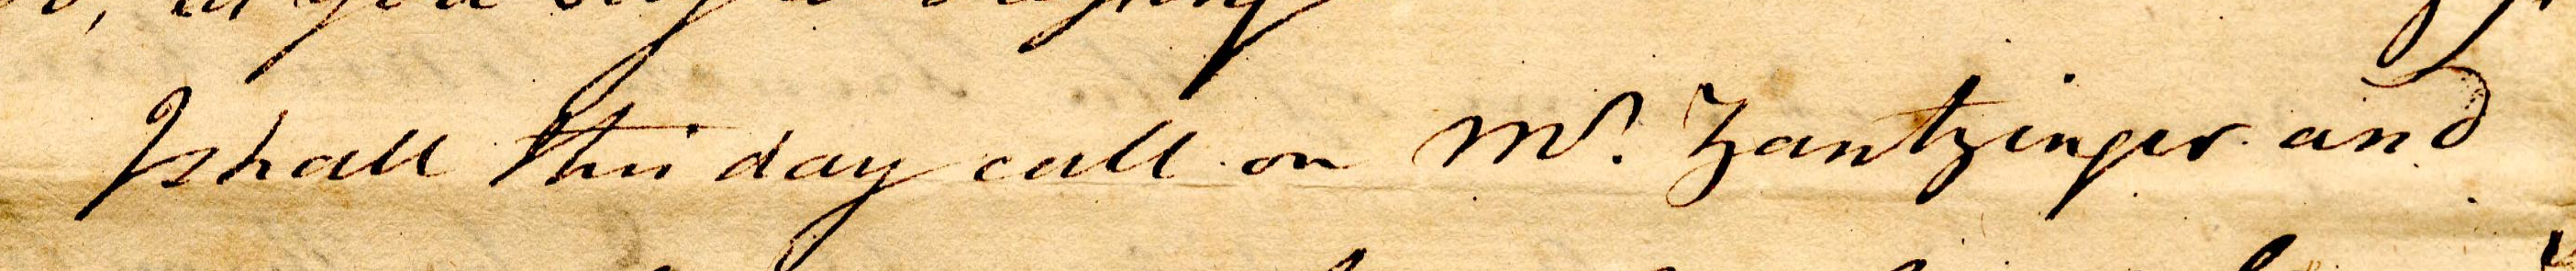I shall this day call on M^r. Zantzinger and
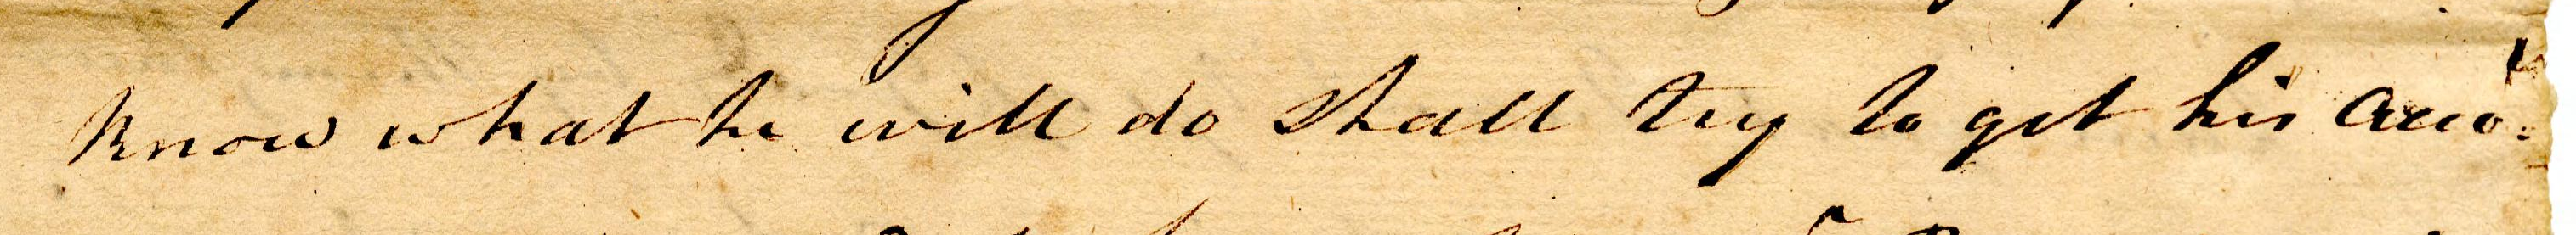know what he will do shall by to get his Acco^t
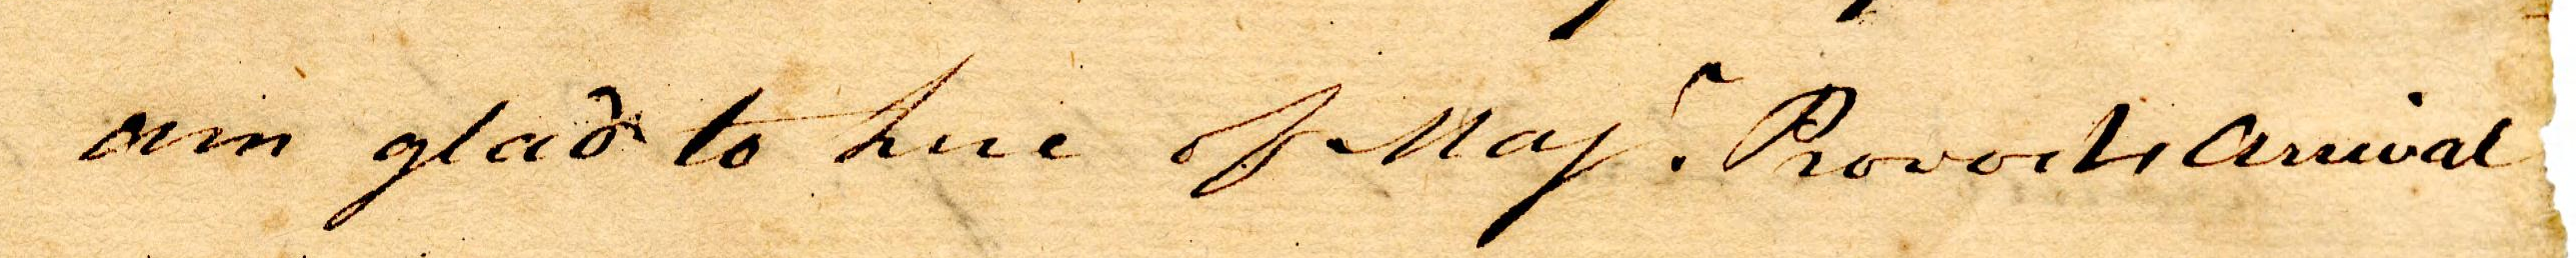am glad to here of Maj^r. Provorts arrival
